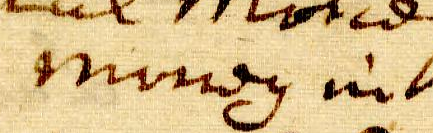money in
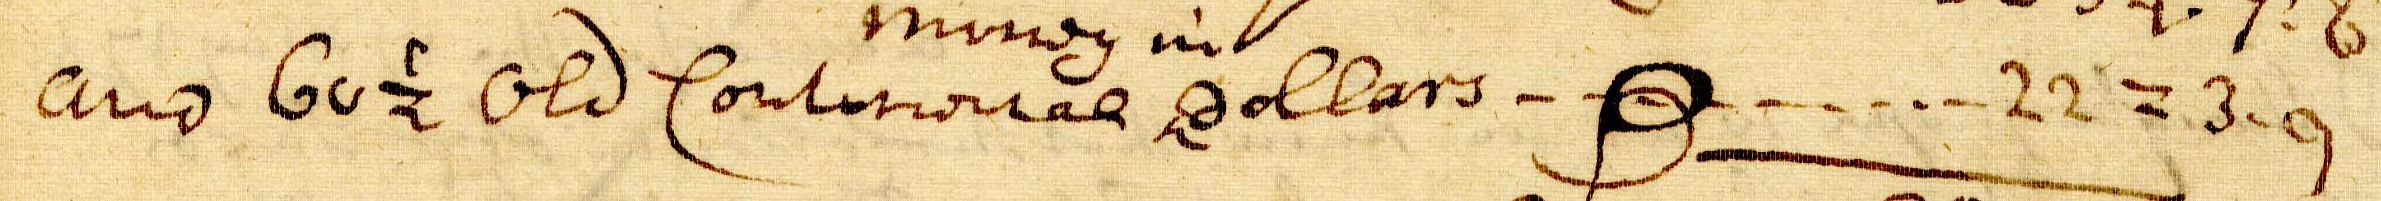and 60 1/2 old Continental Dollars---------22=3-9
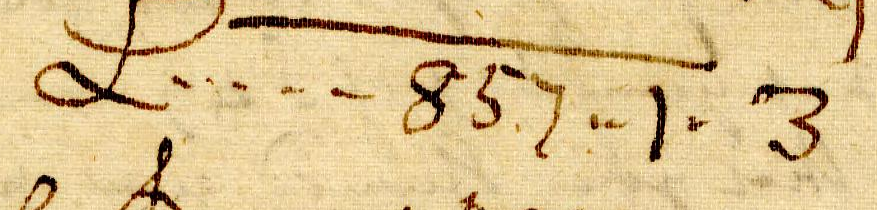£.....857.1.3
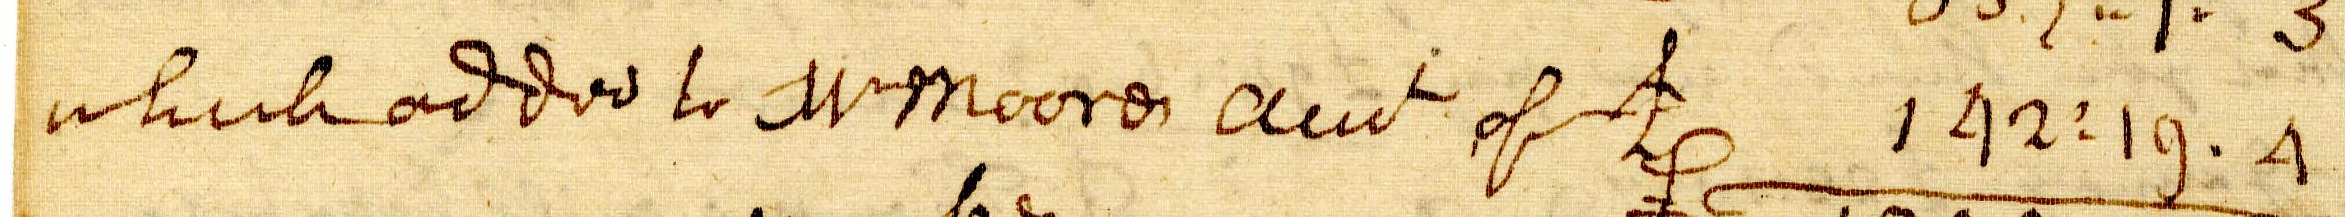which added to M^r Moores Acc^t of £142:19.4
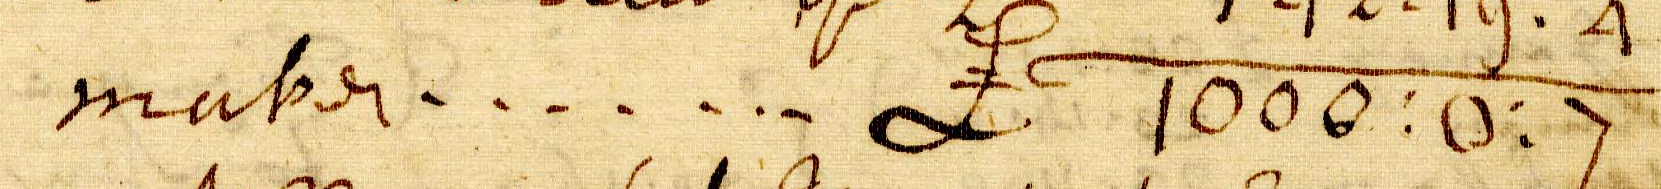makes....... £ 1006:0:7
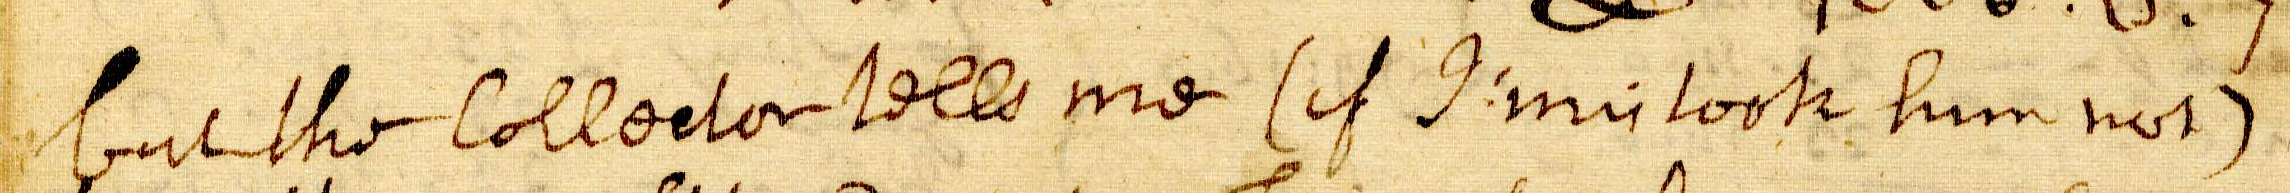but the Collector tells me (if I mistook him not)
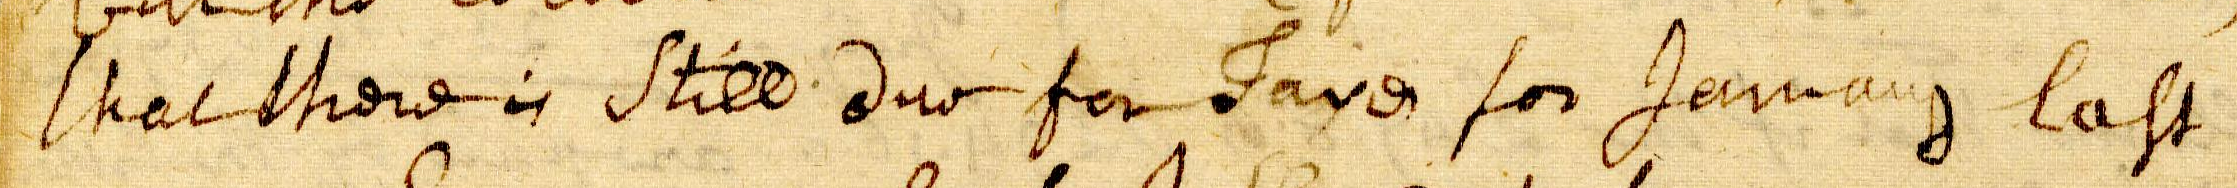that there is Still due for Taxes for January last
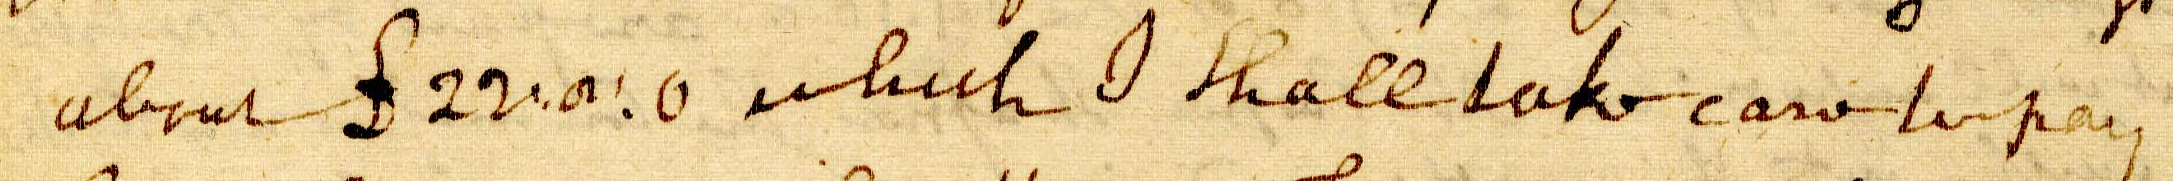about £22:0:0 which I shall take care to pay
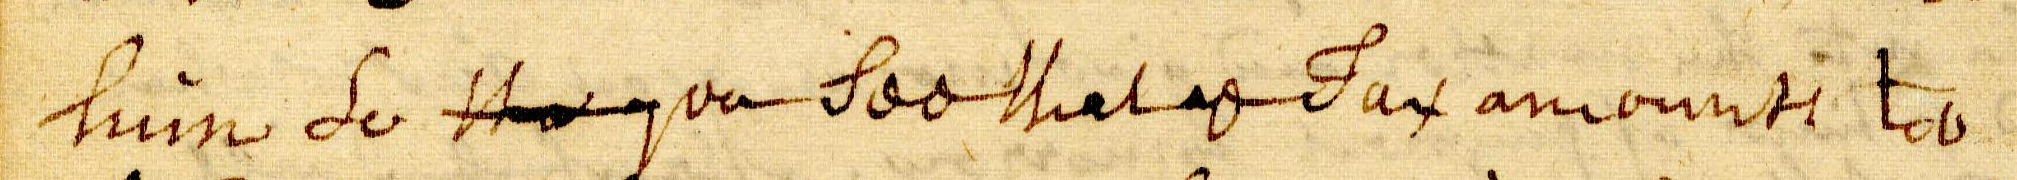him So [that] you see that y^e Tax amounts too
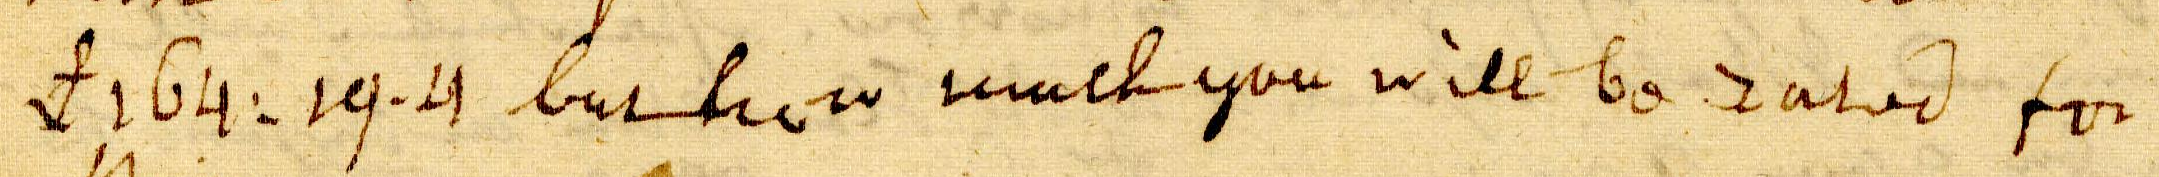£164:19-4 but how much you will be rated for
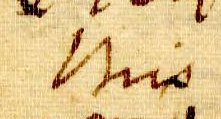this
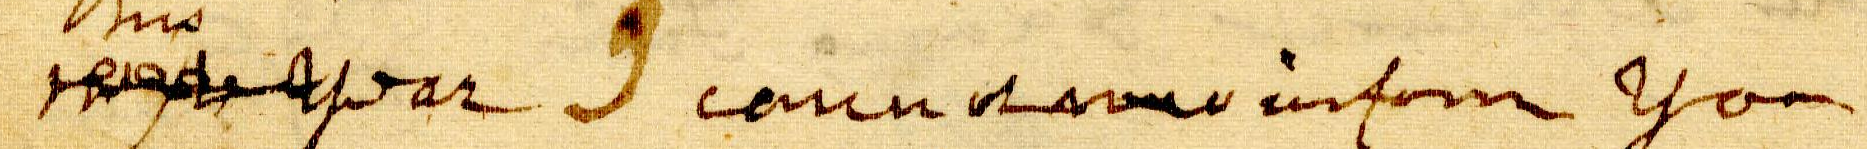[next] Year I cannot [_____] inform You
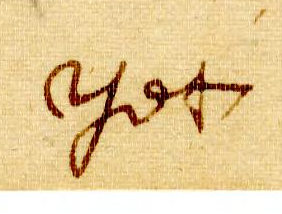Yet
